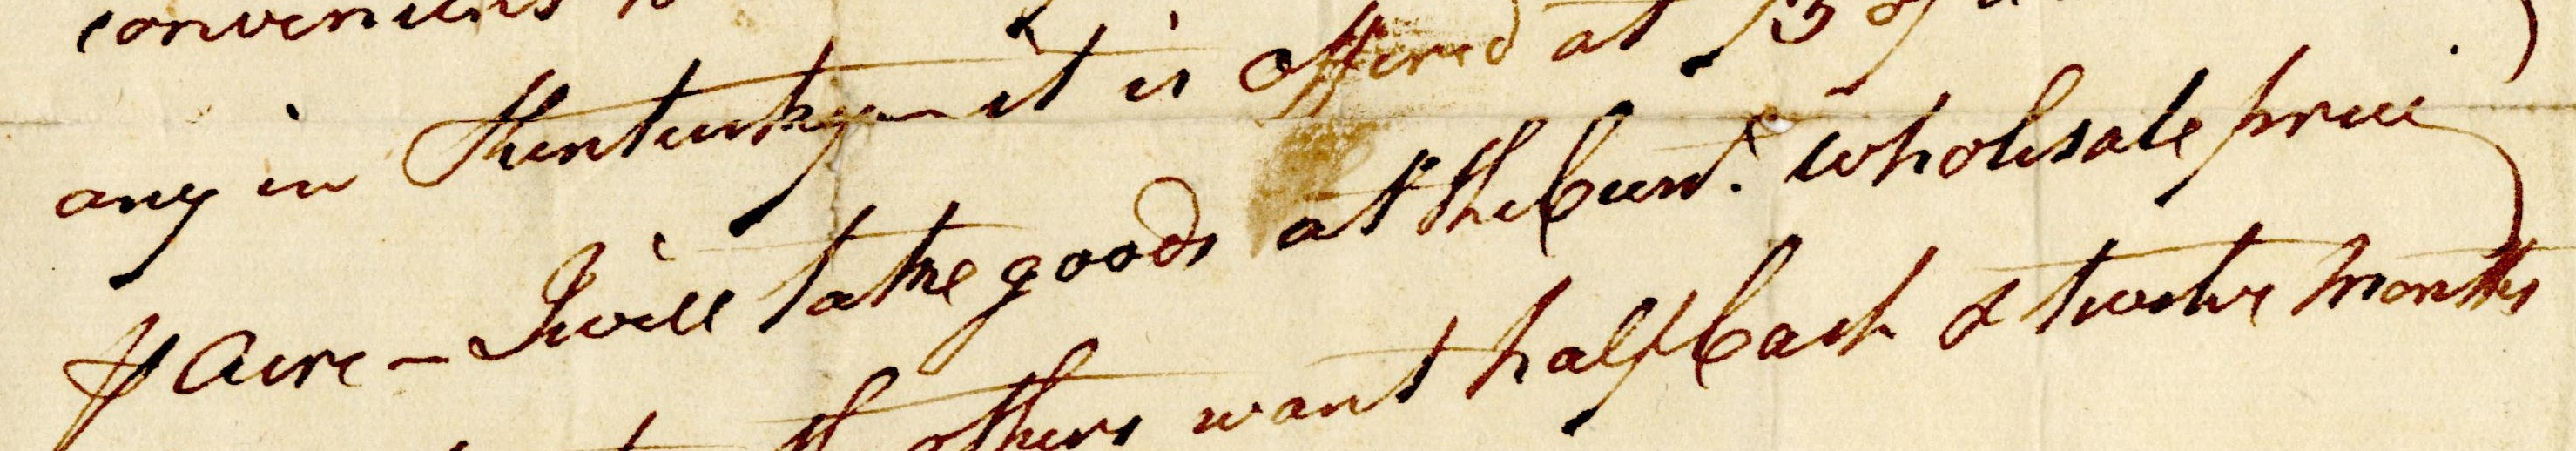per acre- I will take the goods at the Cur^t. wholesale price
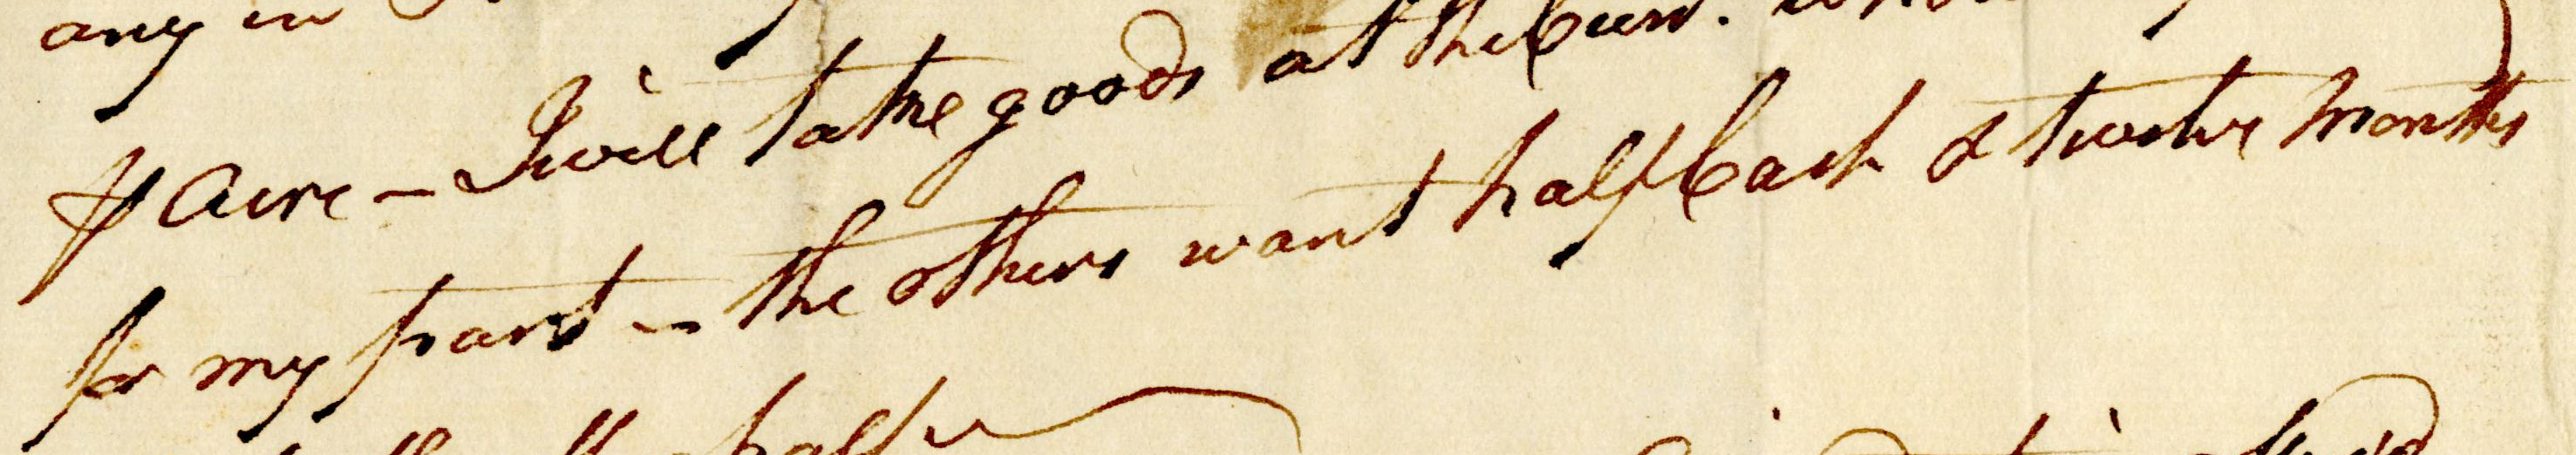to my part- the others want half Cash & twelve Months
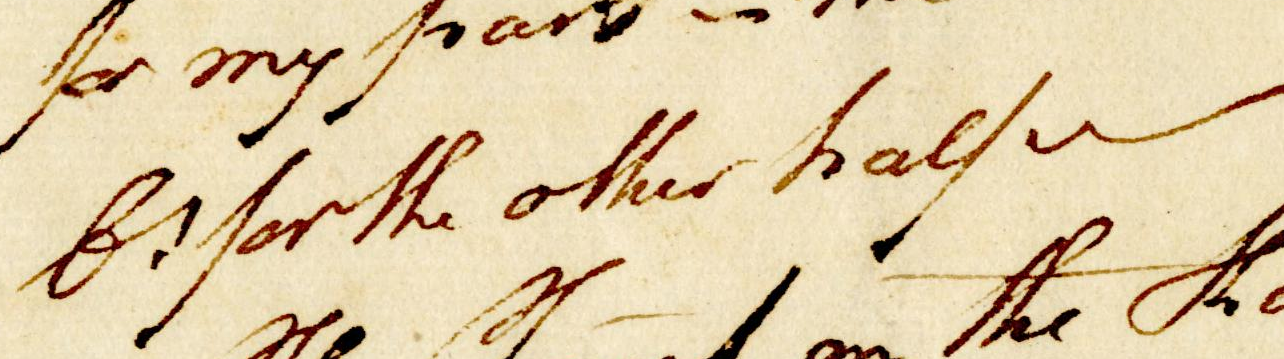C^r. for the other half-
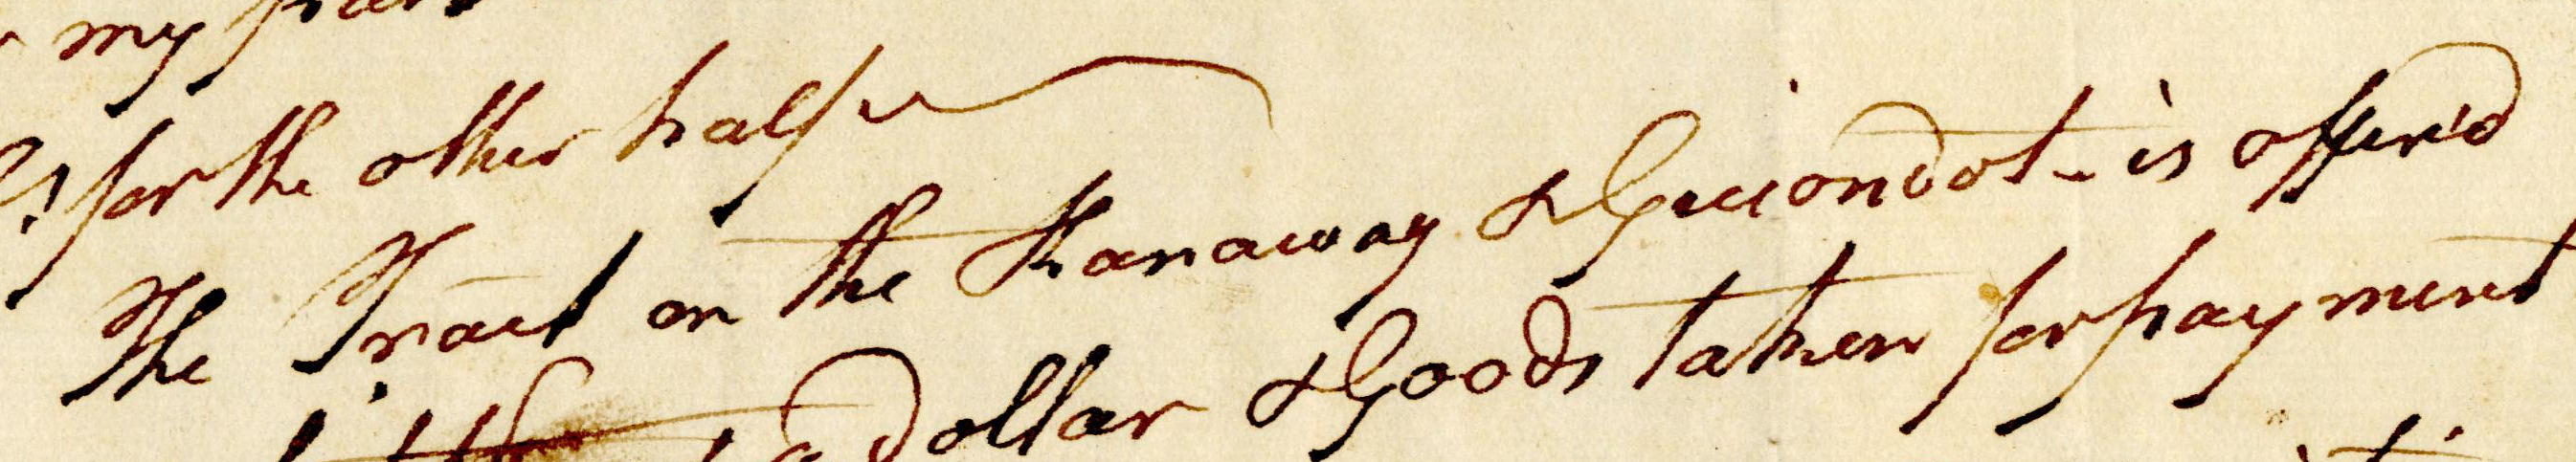The Tract on the Kanaway & Georgedot is offer'd
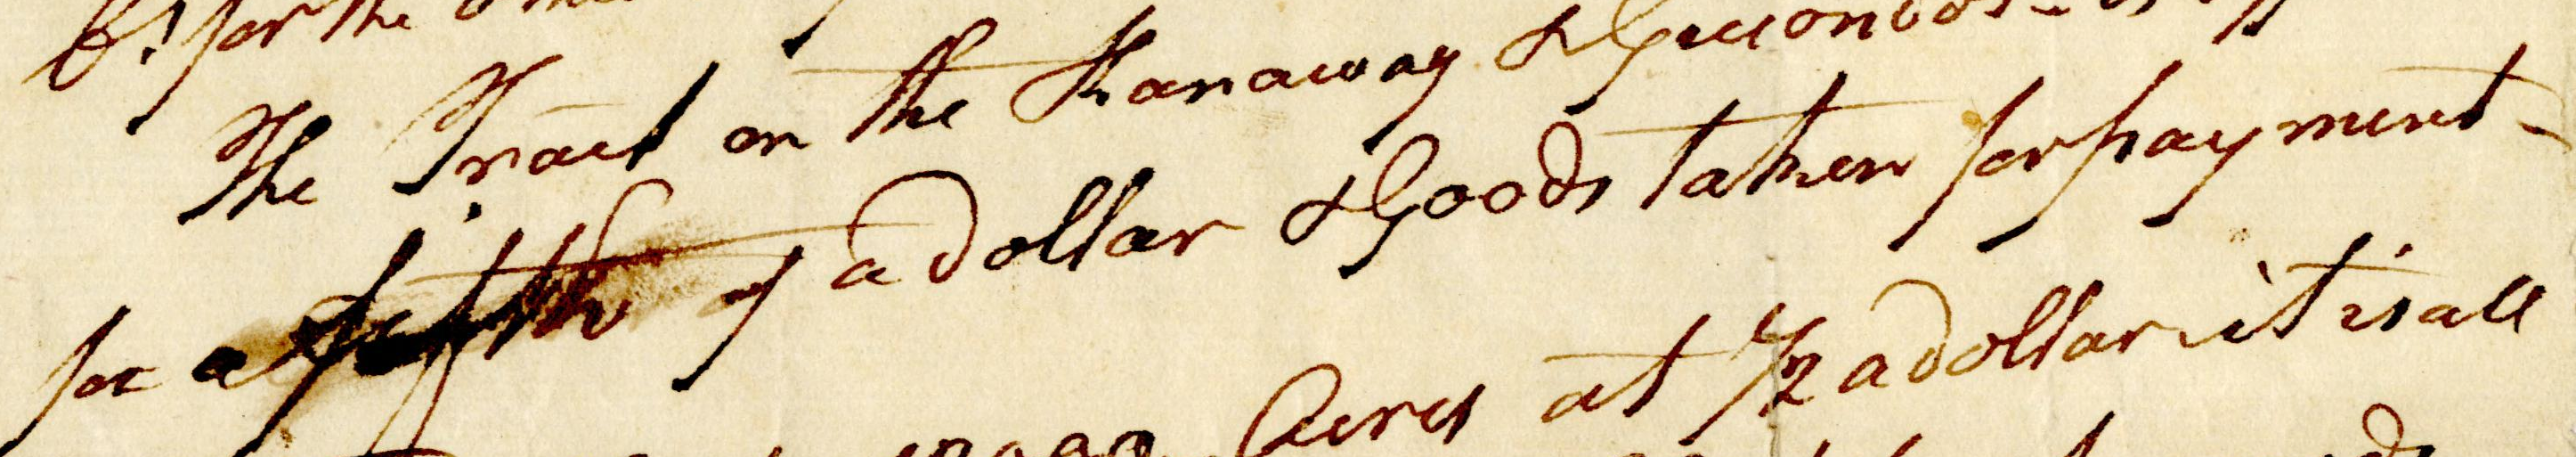for a fifth of a dollar & Goods taken for payment.
